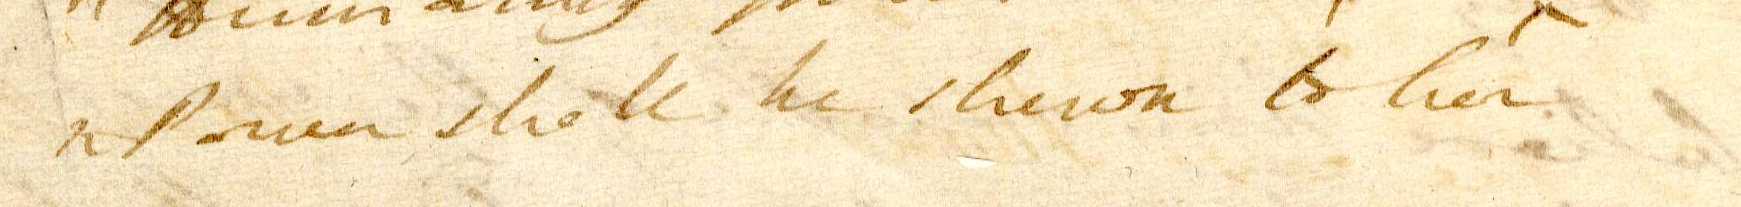a Power shall be shewn to her.
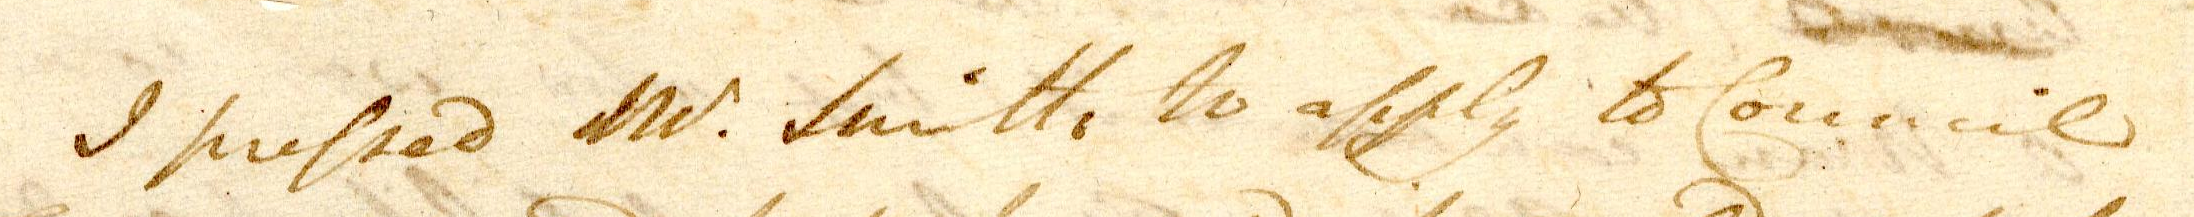I pressed M^r. Smith to apply to Council
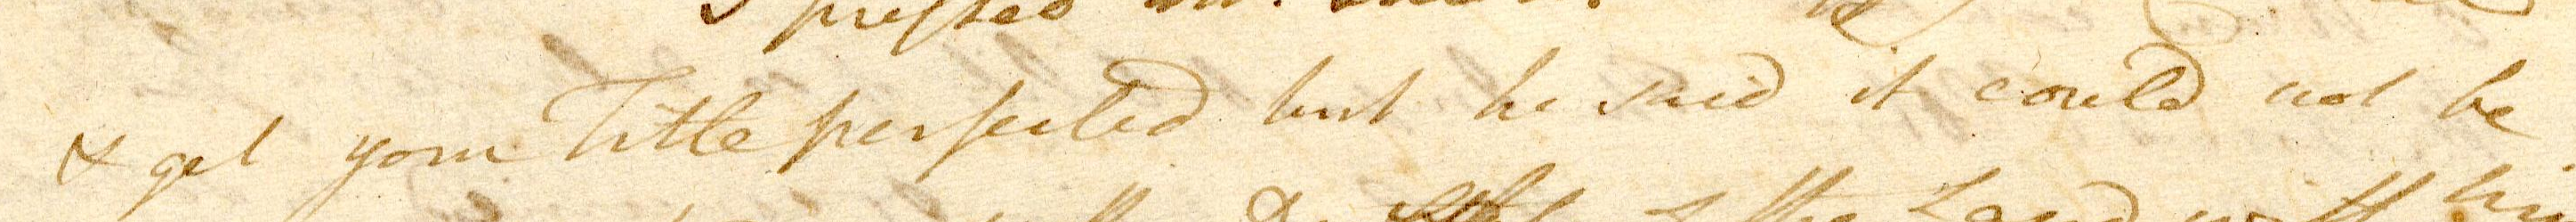& get your little perfected but he said it could not be
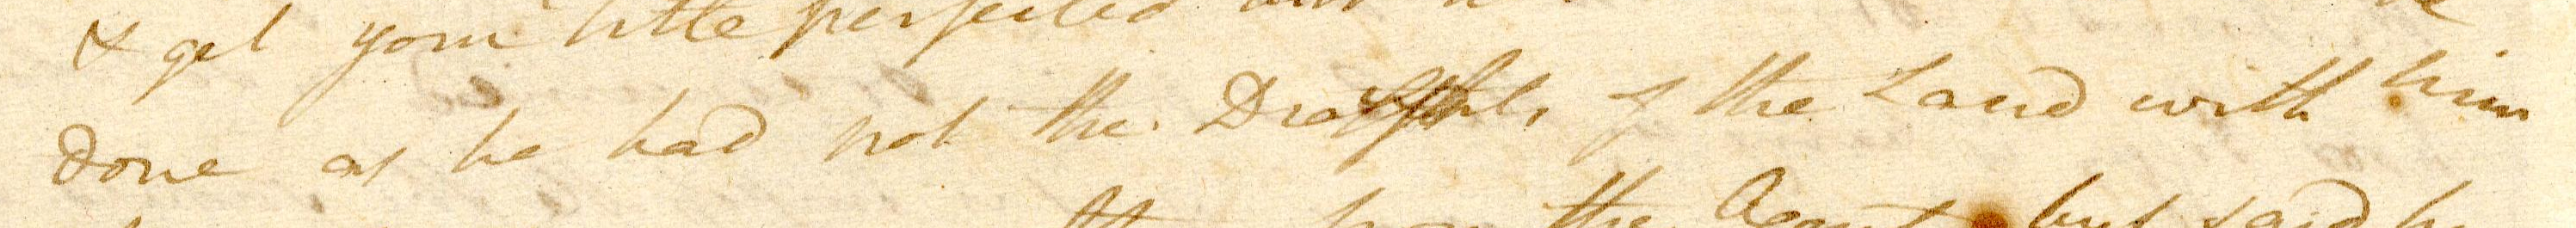done as he had not the Draughts & the land with him
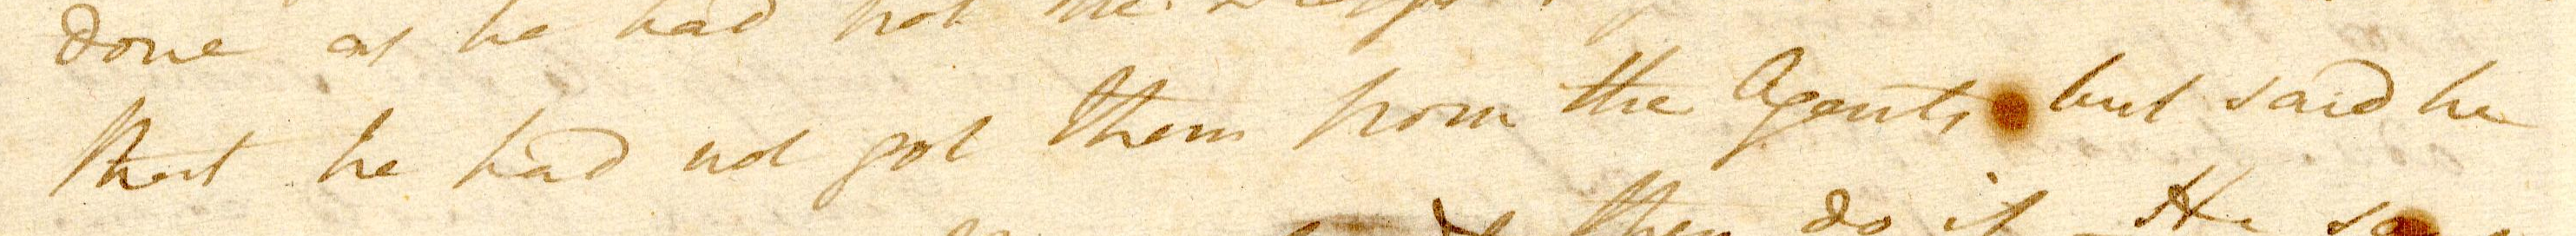that he had not got them from the Yeats but said he
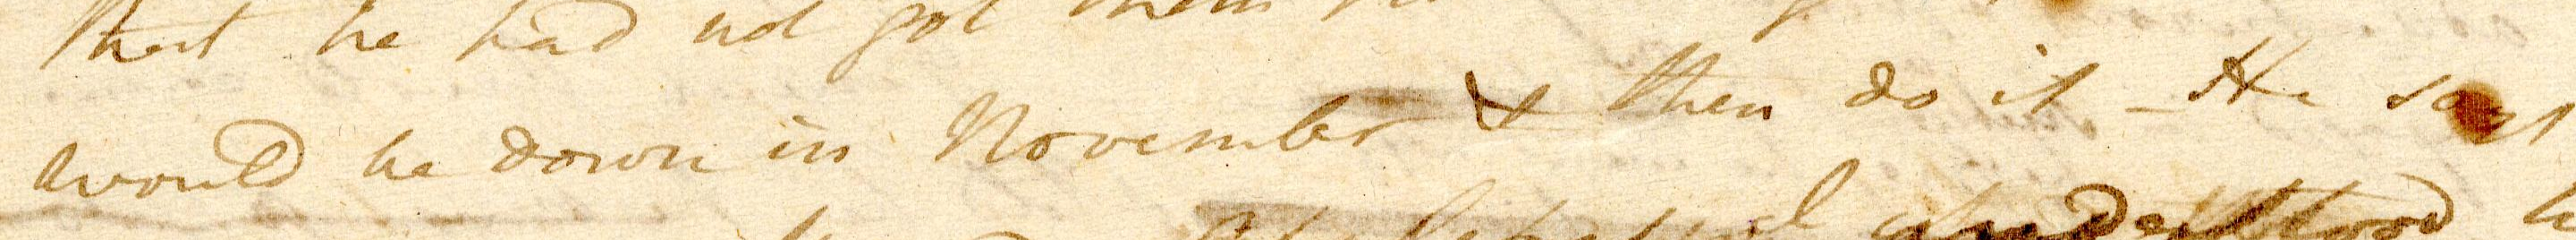would be down in November & then do it. He says
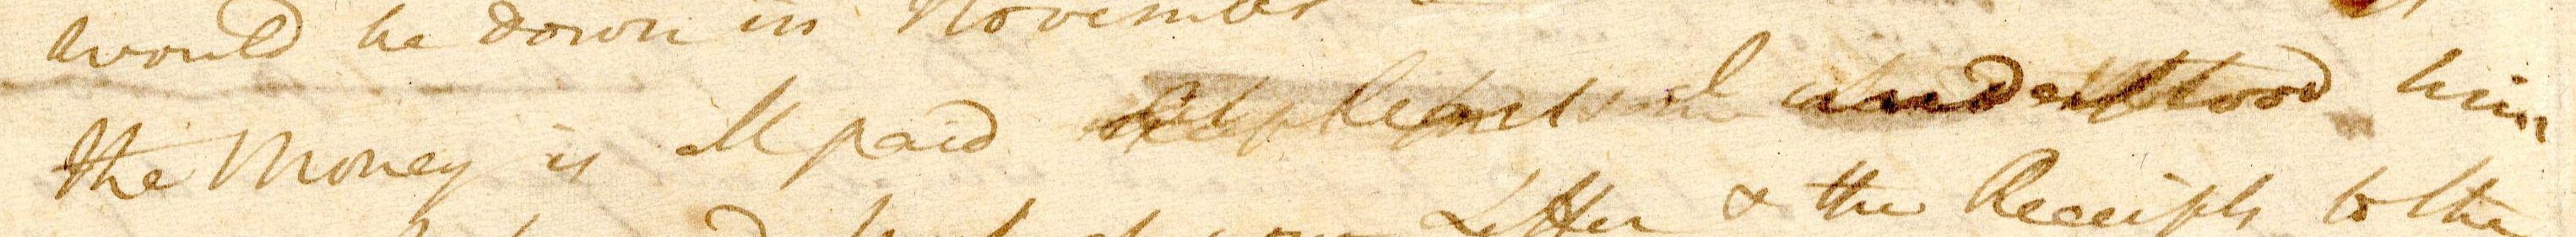the Money is all paid [__________] I understood him
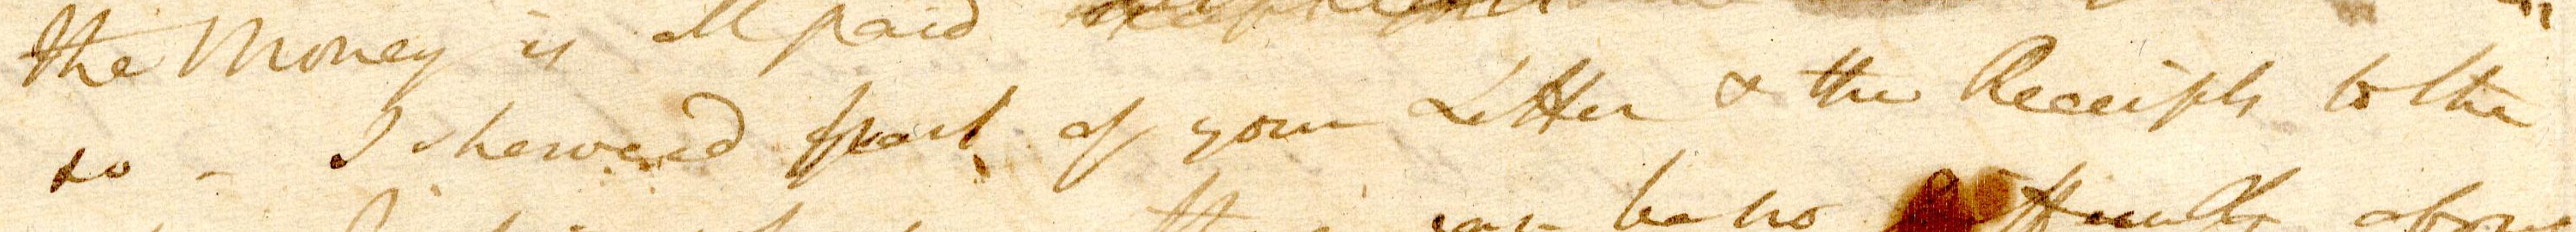so. I showed front of your Letter & the Receipts to the
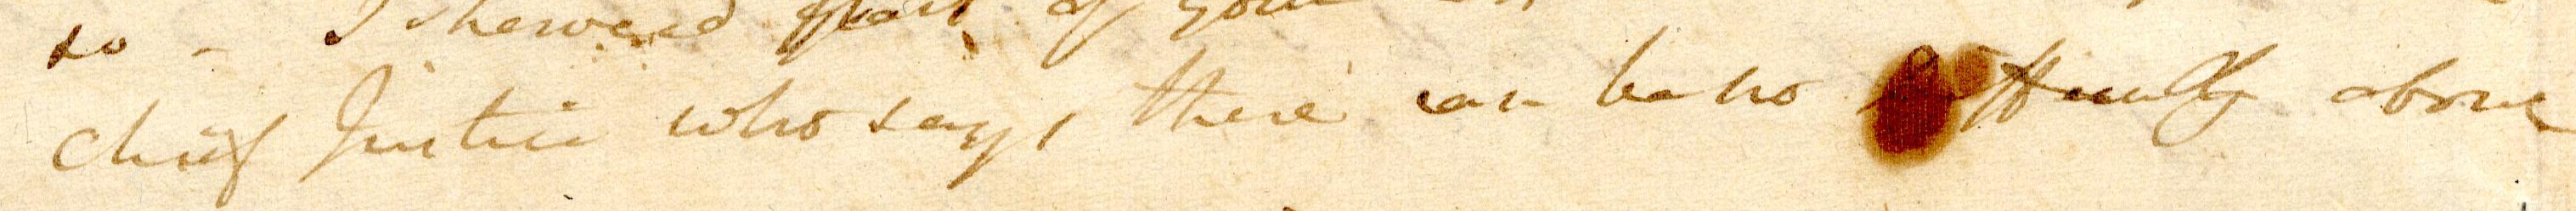Chief Justice who says there can be no family above
